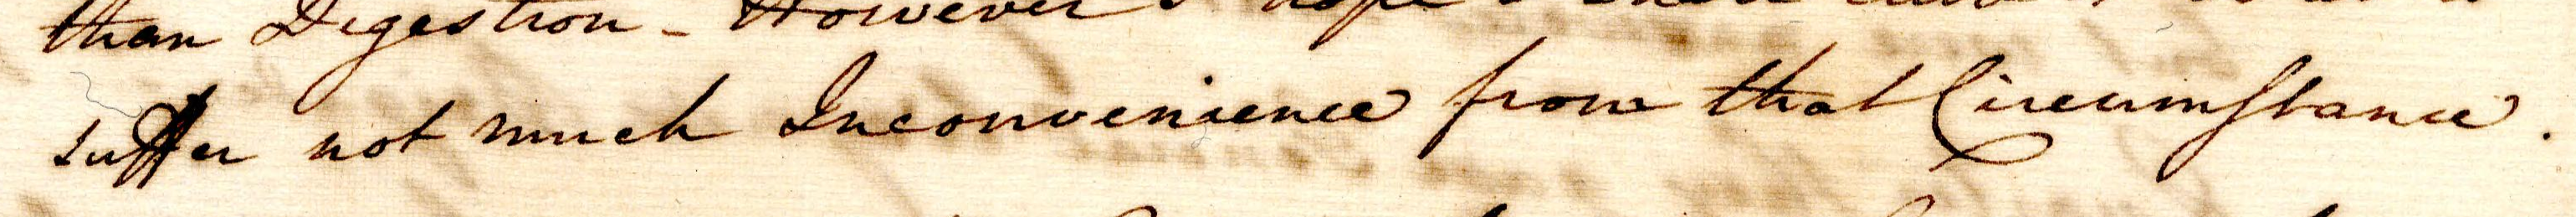suffer not much Inconvenience from that Circumstance.
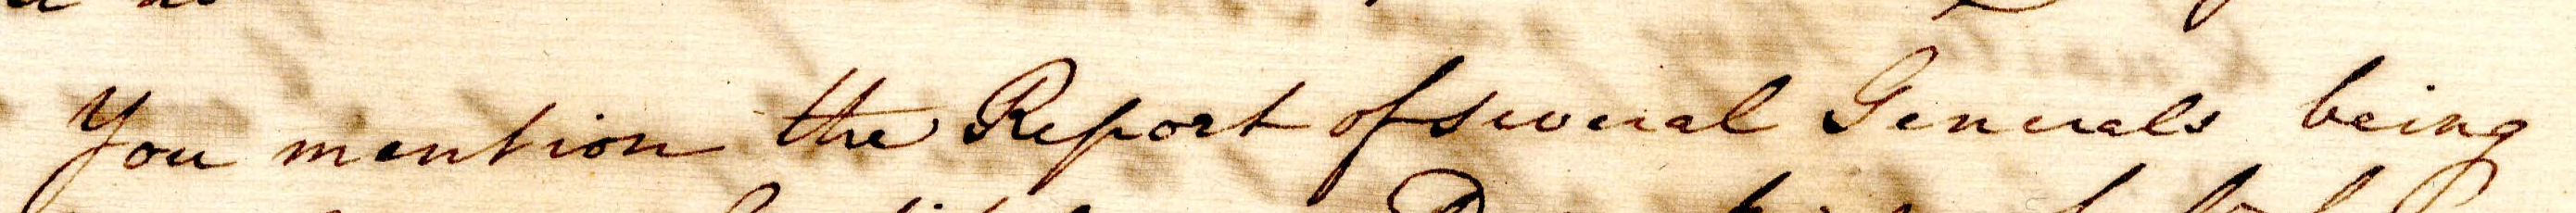You mention the Report of several Generals being
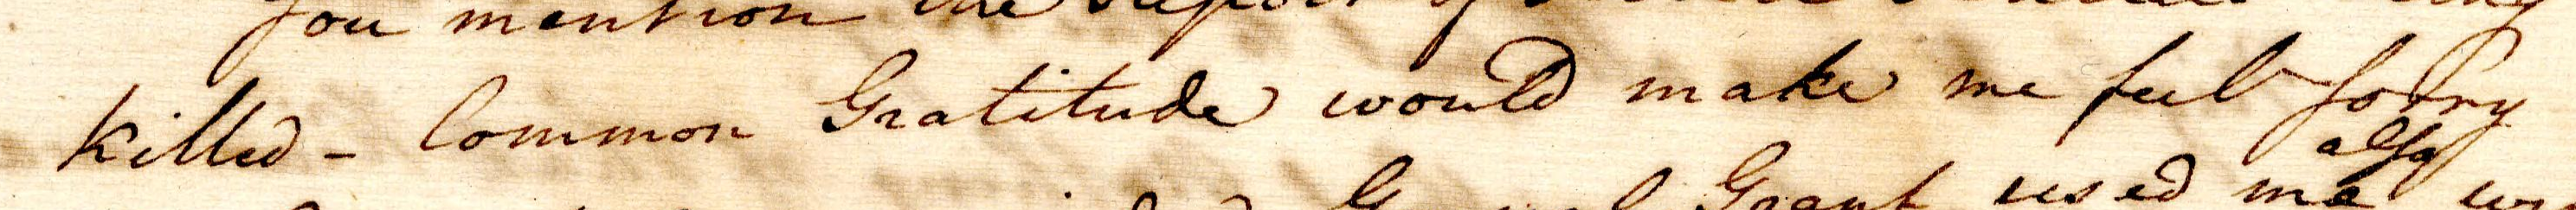killed- Common Gratitude would make me ful sorry
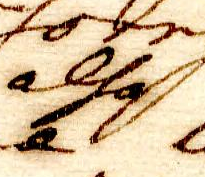also
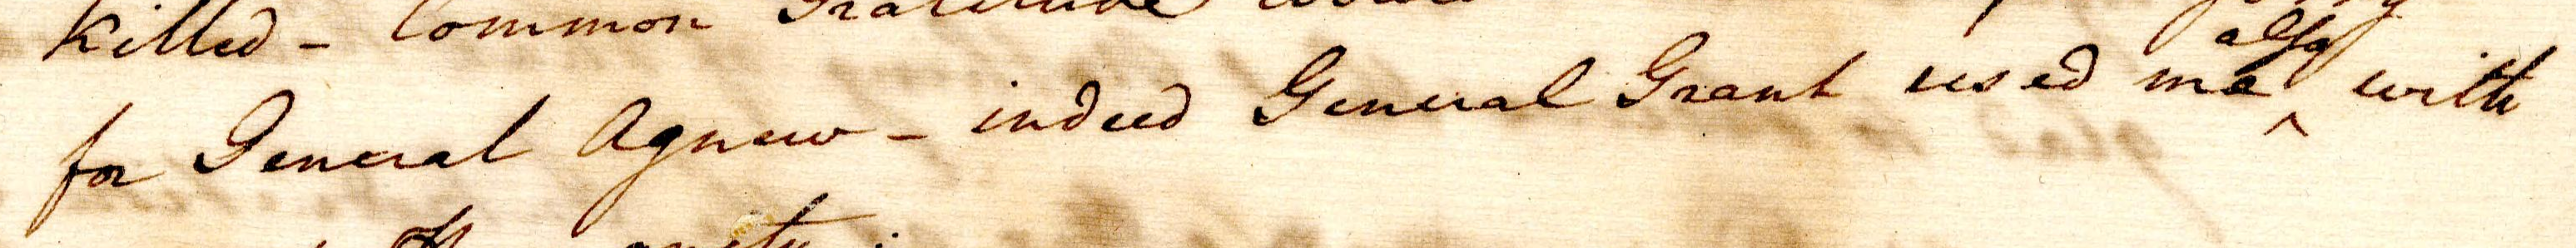for Generel Agnew- indeed General Grant used me ^ with
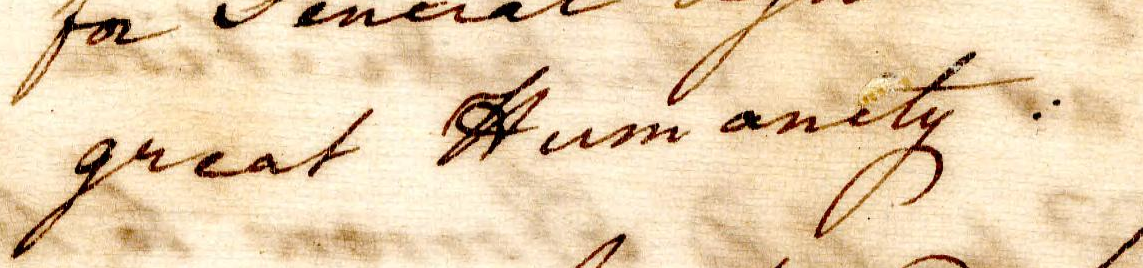great Humanity:
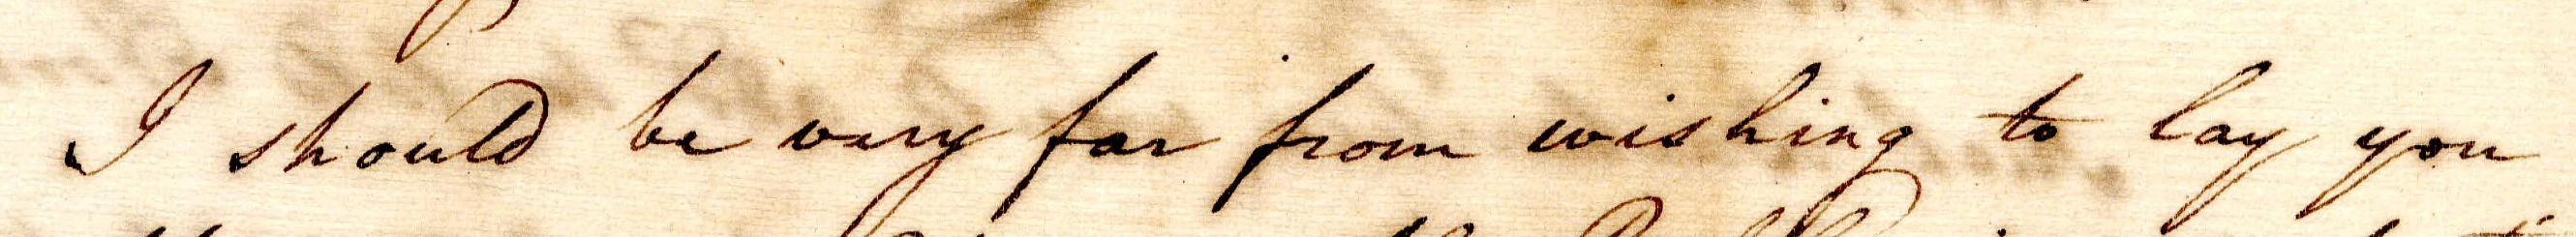I should be very far from wishing to lay you
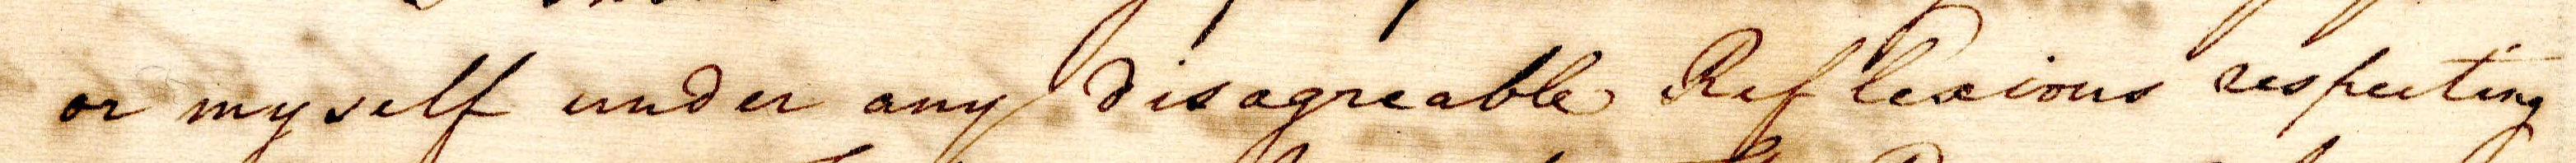or myself under any disagreable Reflexions respecting
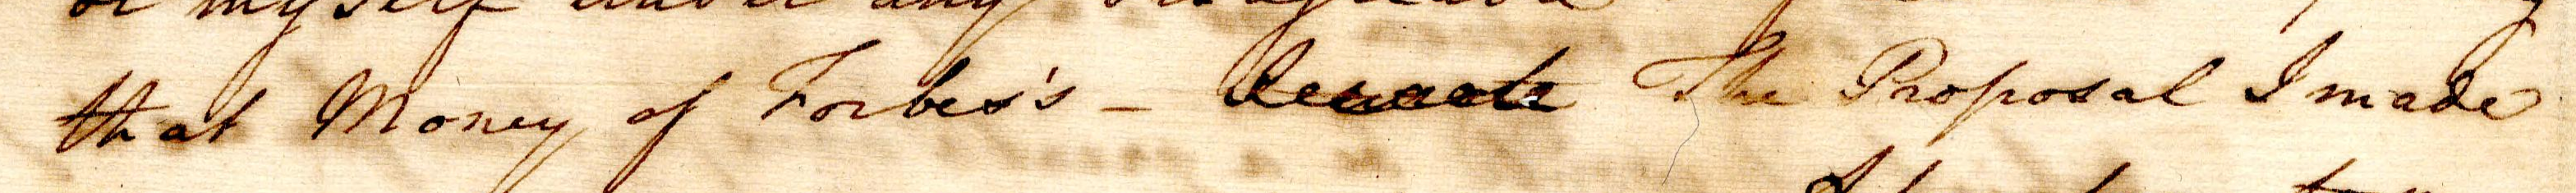that Money of Forbes's- [________] The Proposal I made
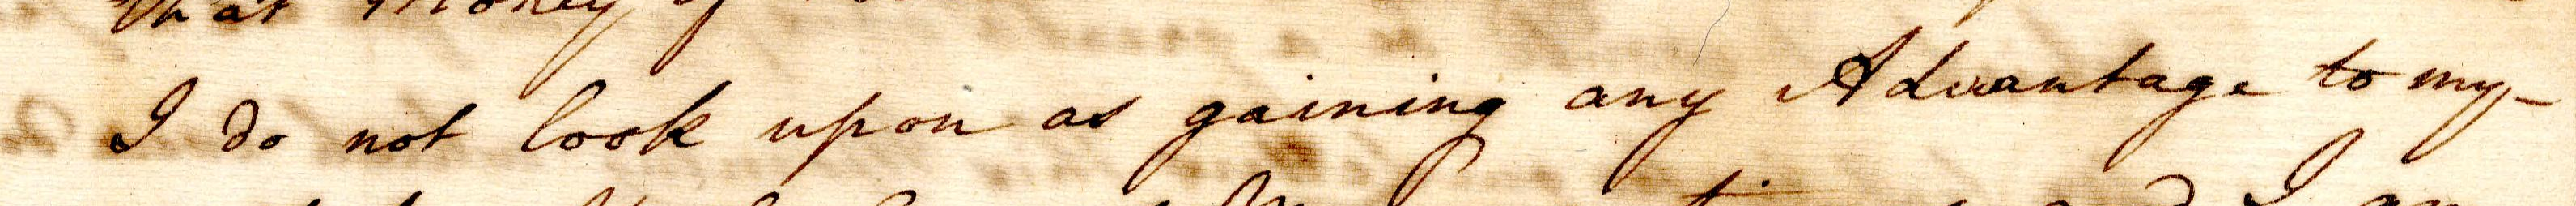I do not look upon as gaining any Advantage to my-
